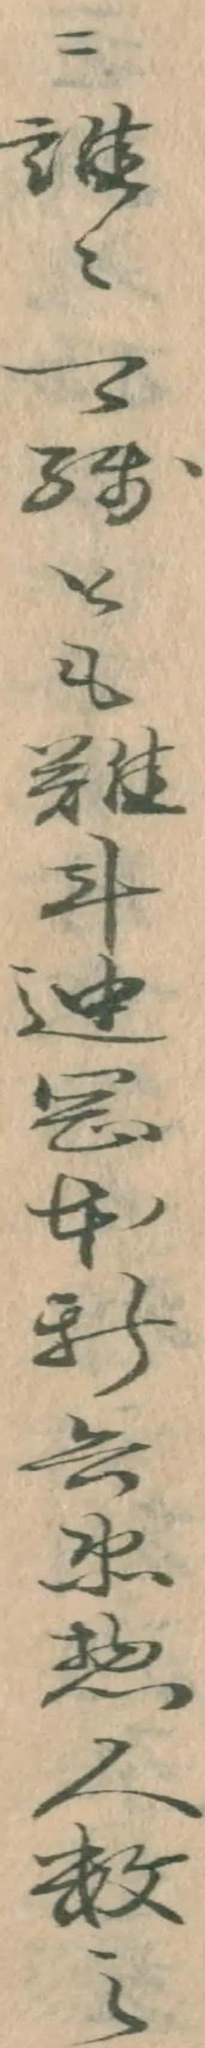に誰々可残とも難斗迚岡本新兵衛惣人数之
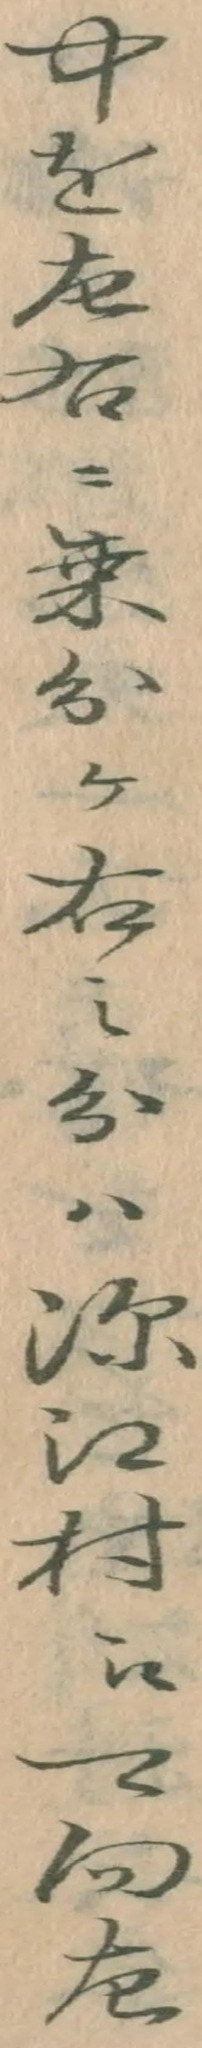中を左右に乗分ヶ右之分は深江村え可向左

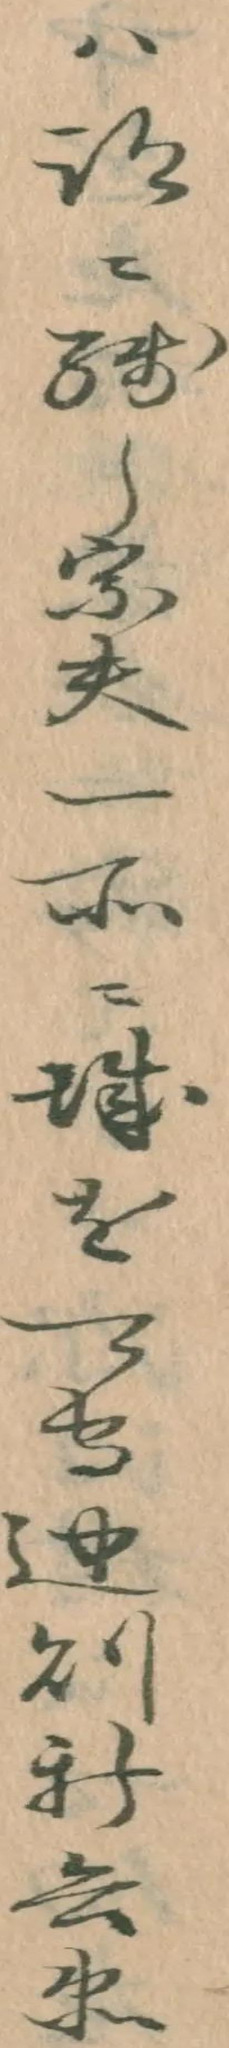は跡に残し宗夫一所に城を可守迚則新兵衛
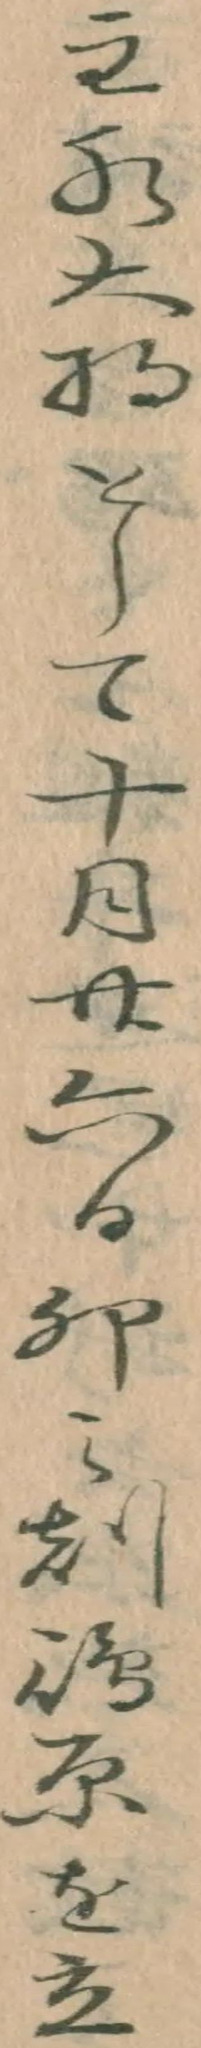主水大将として十月廿六日卯之刻島原を立
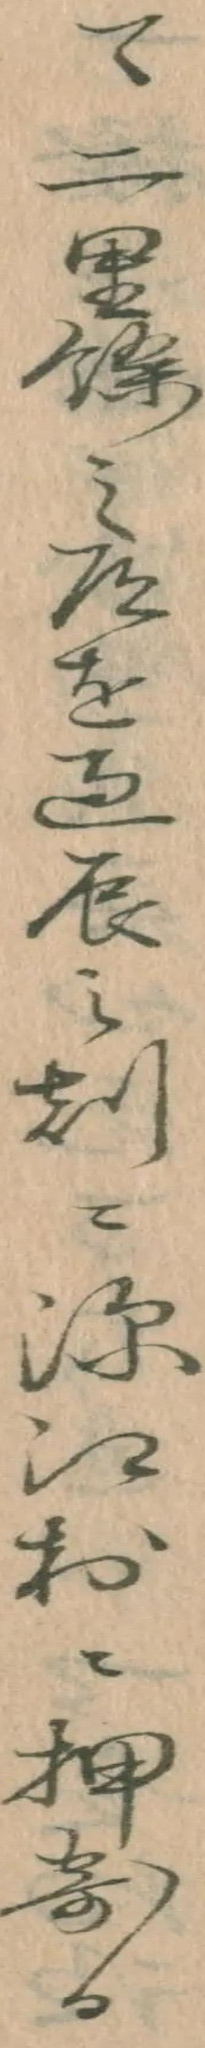て二里余之道を過辰之刻に深江村に押寄る
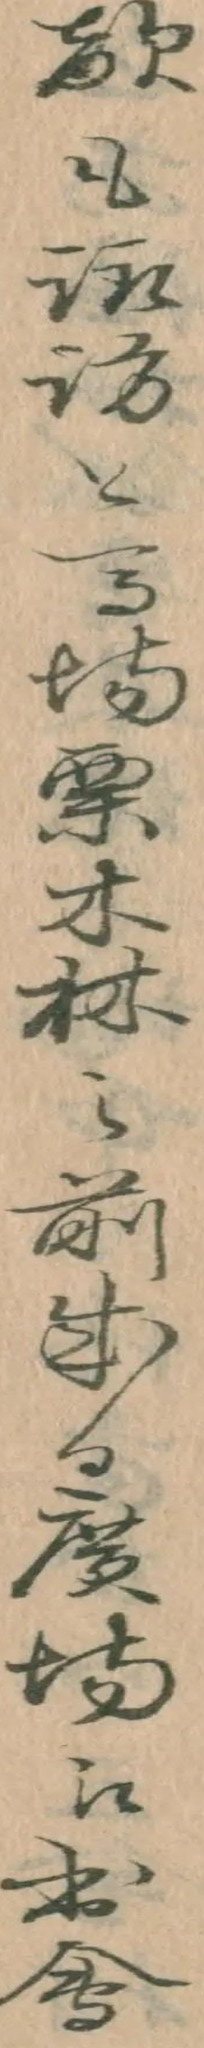敵も諏訪と馬場栗木林之前成る広場え出会
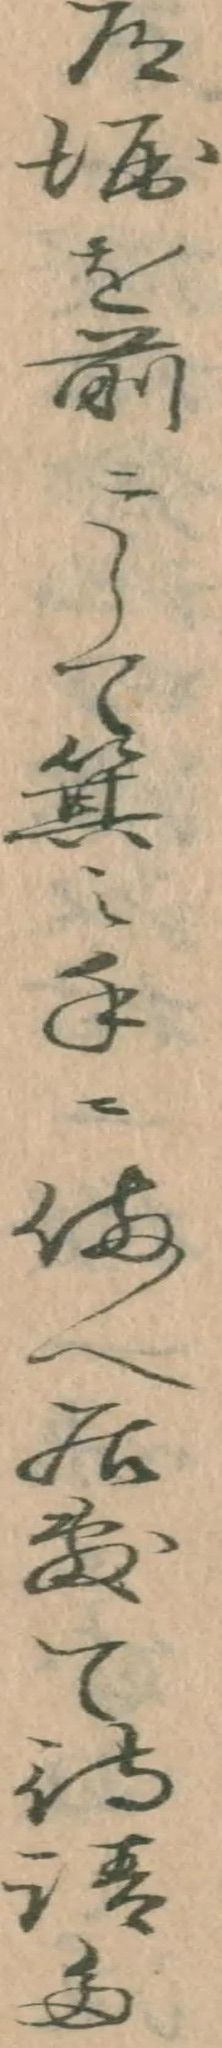道堀を前にして箕之手に備へ居敷て待請た
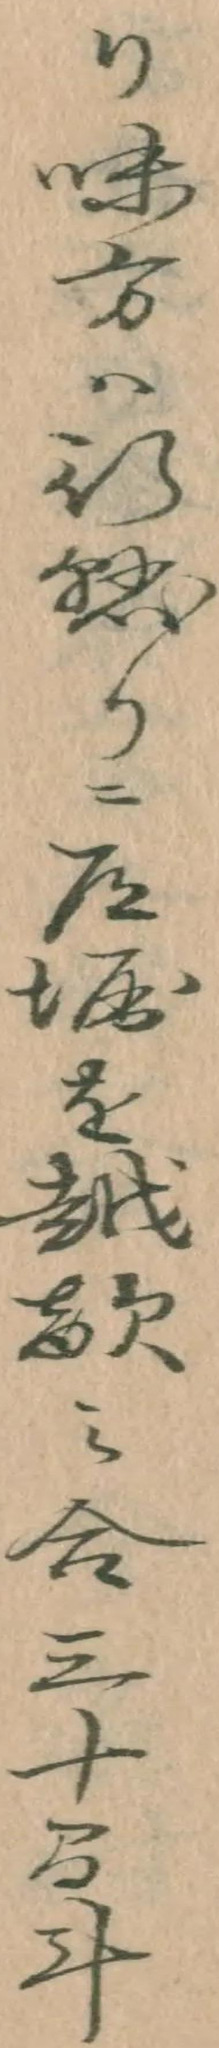り味方は懸りに道堀を越敵之合三十間斗
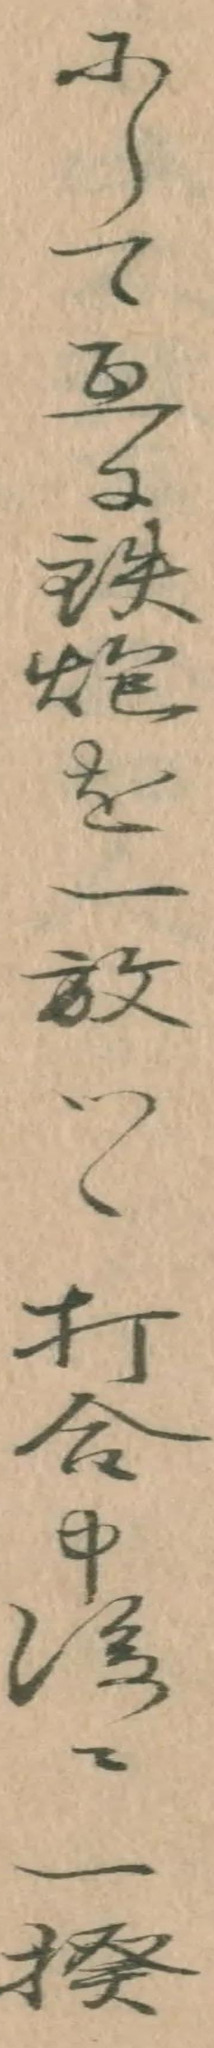にして互に鉄炮を一放つゝ打合申後に一揆
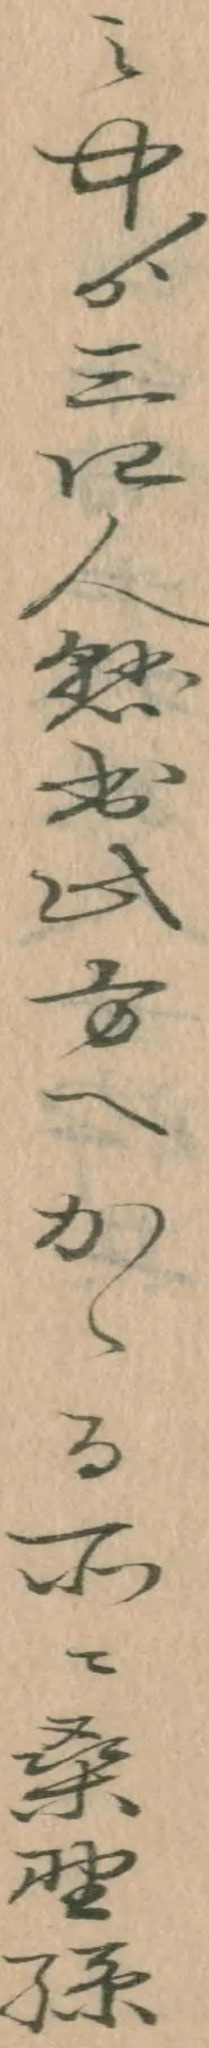之中ゟ三四人掛り懸出此方へかゝる所に桑野孫
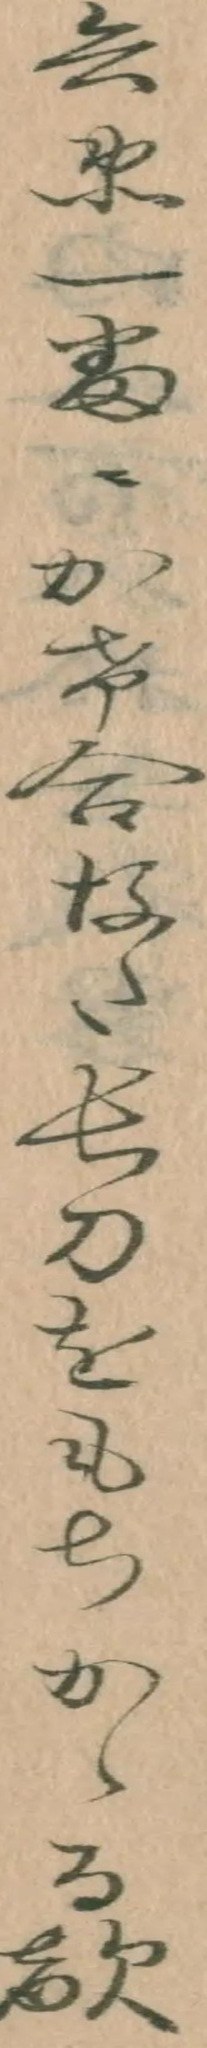兵衛一番にかけ合なた長刀をもちかゝる敵
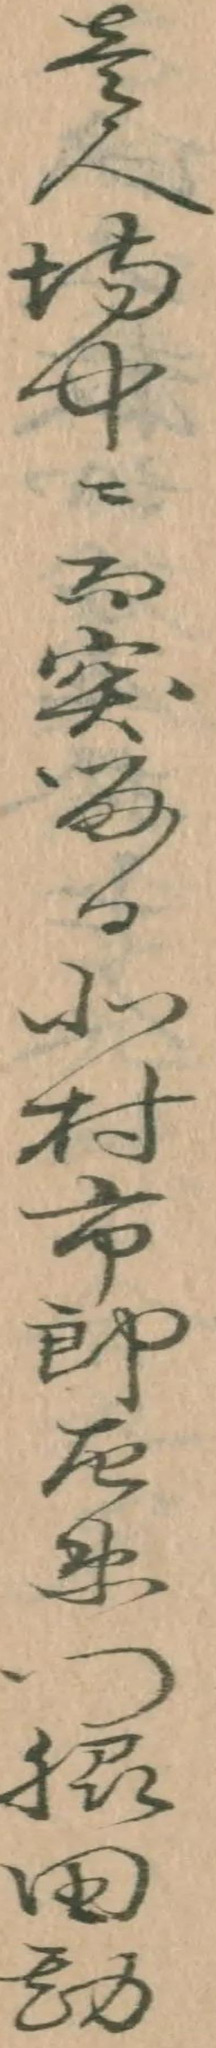壱人場中に而突留る北村市郎左衛門脇田勘
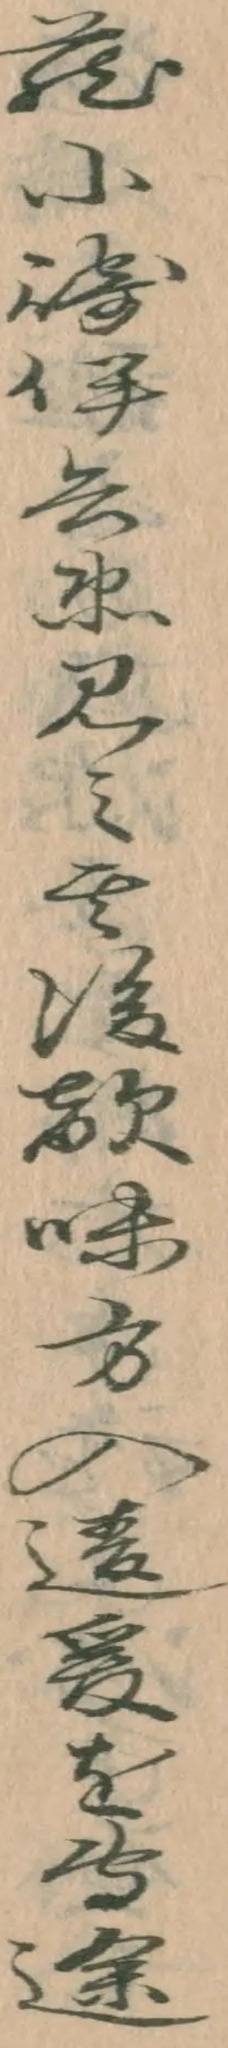蔵小崎伊兵衛見之其後敵味方入違爰を専途
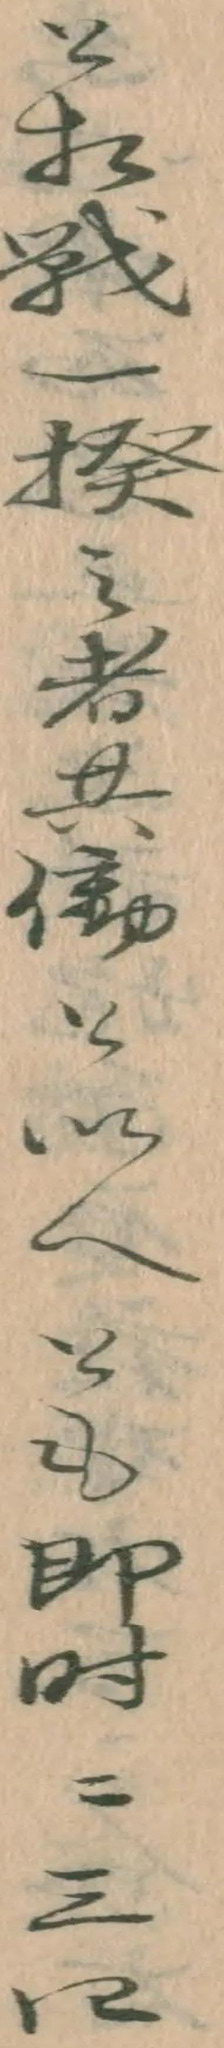と相戦一揆之者共働といへとも即時に三四
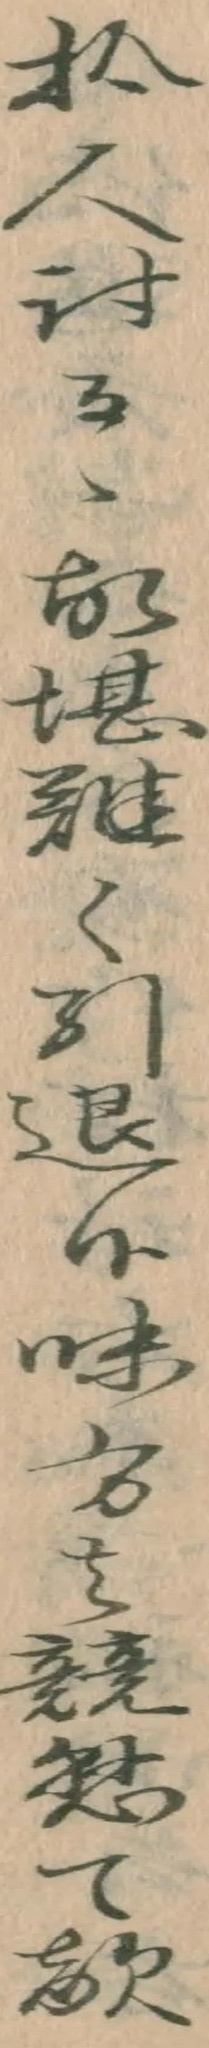拾人討るゝ故堪難く引退候味方は競懸て敵
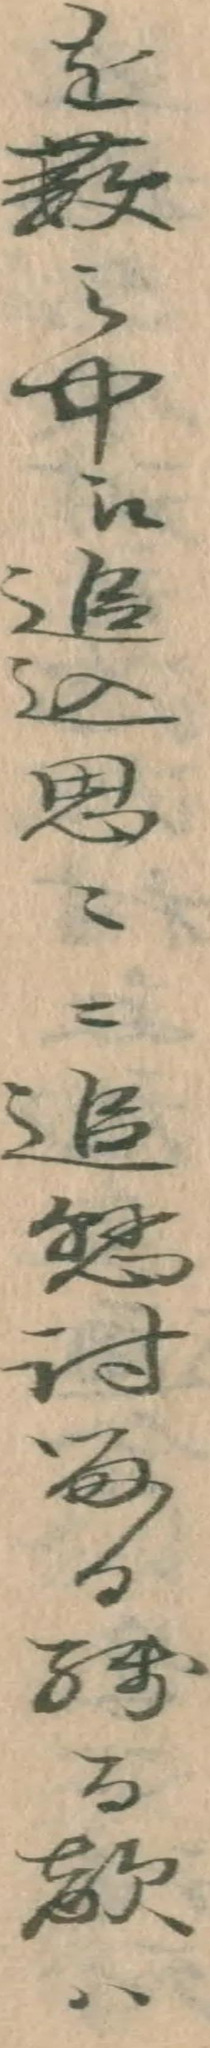を薮之中え追込思々に追懸討留る残る敵は
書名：切支丹御退治記 49巻. [1]
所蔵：国立国会図書館 National Diet Library, JAPAN
